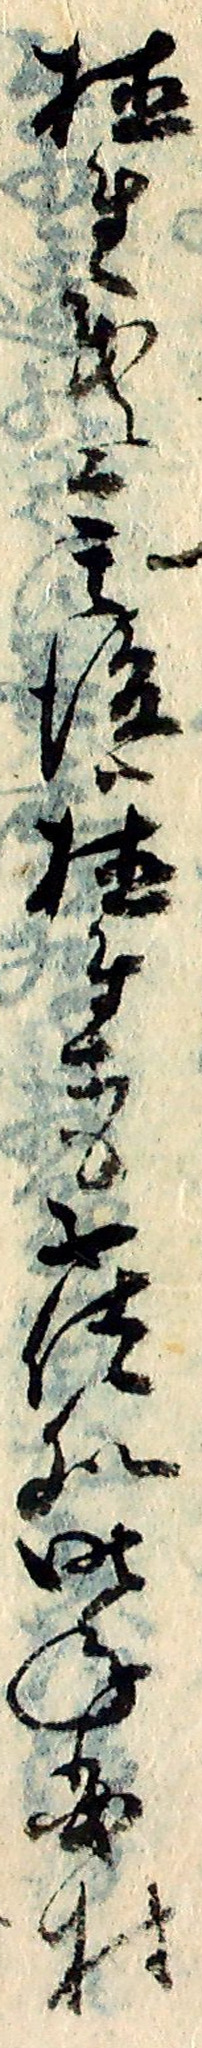植付候義にて其後は植付等も不仕候処昨年当村
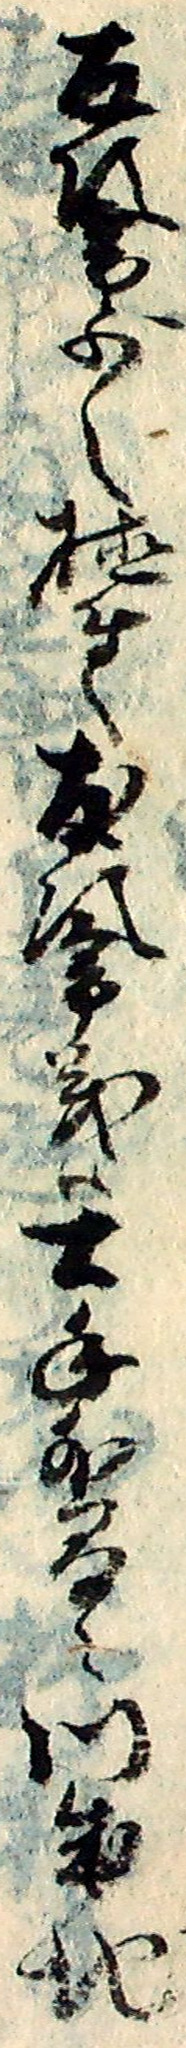友次郎少し植付候友次郎義は土手外間に川成地
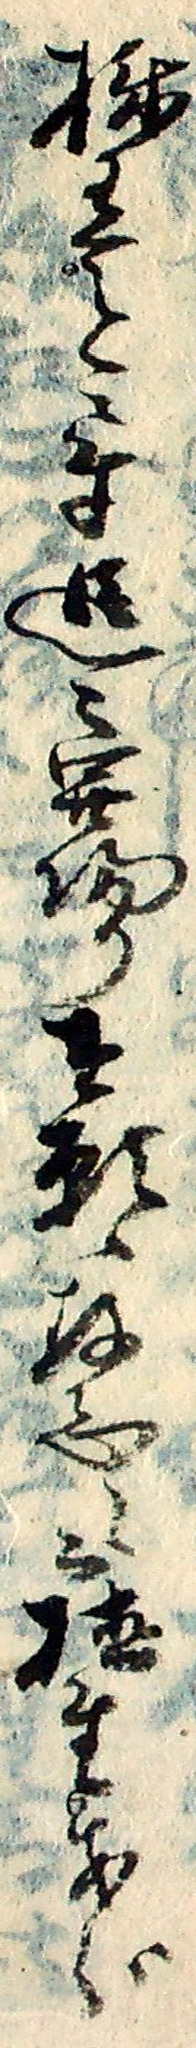株有之候に付追々開帰り奉願候存志にて植付候義哉
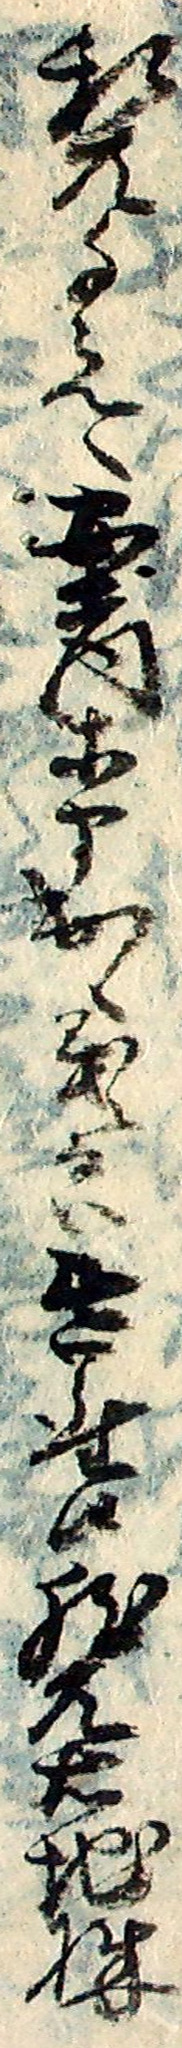私共手元へ案内等申出候義にては無御座候然共右地株
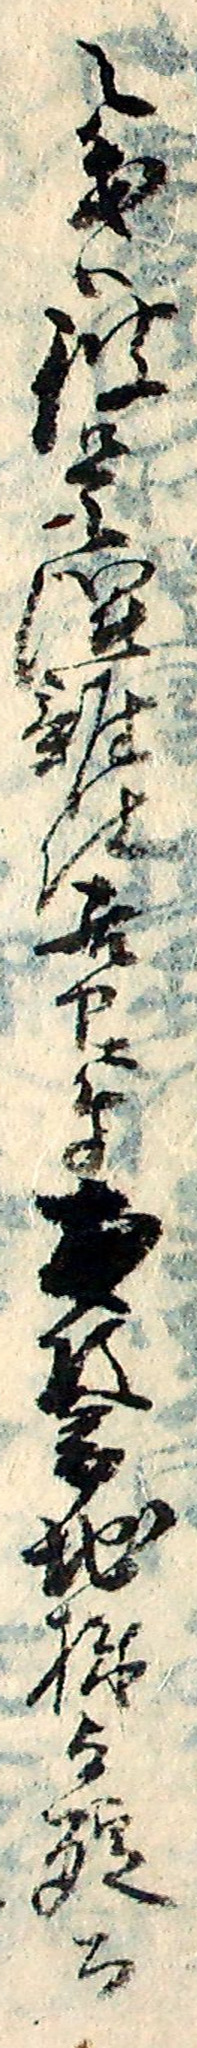之義は彼是混雑仕居申に付友次郎地株と聢と
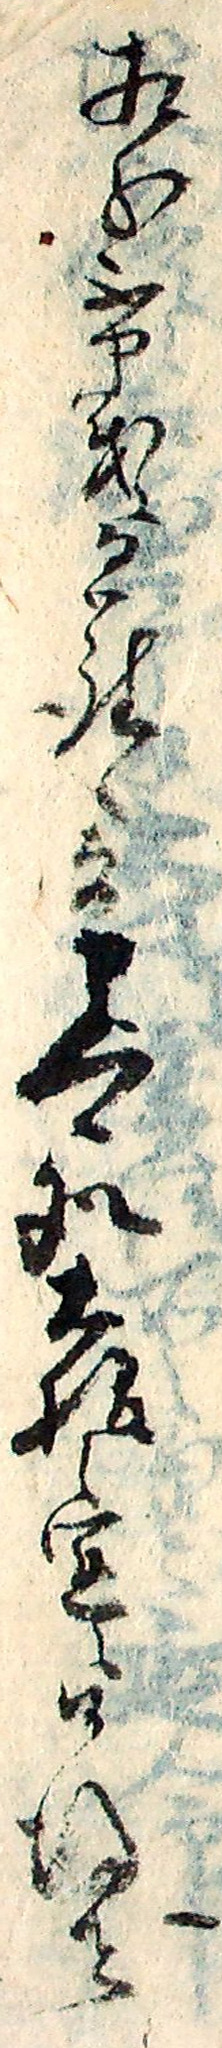相分不申義にて御座候旨申上候処右様之運に候得は

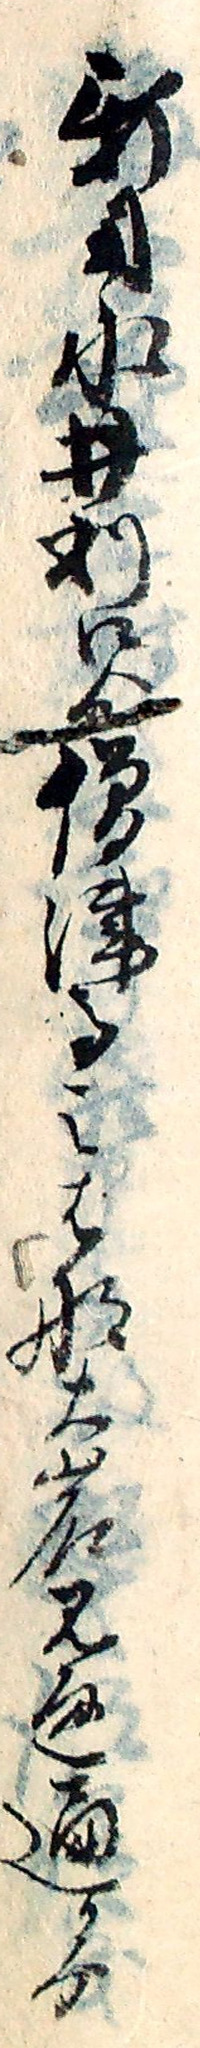新用水井利口ゟ僧津高之はな大岩見通通りゟ
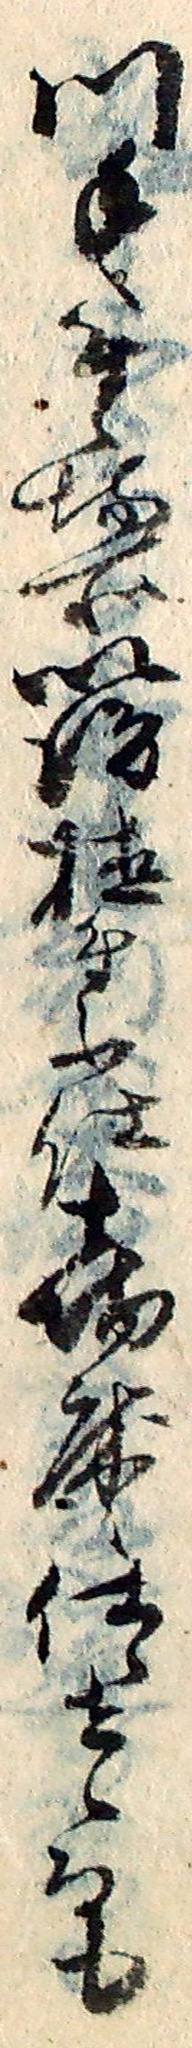川手へ付候場所以後植付不仕土場成に仕らせ候ても
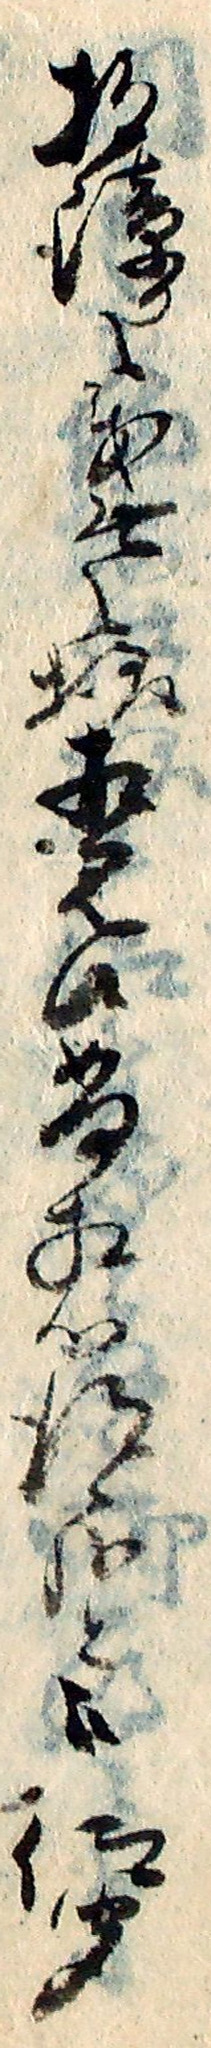指障り之義無之様相見候如何相心得候哉と被仰聞
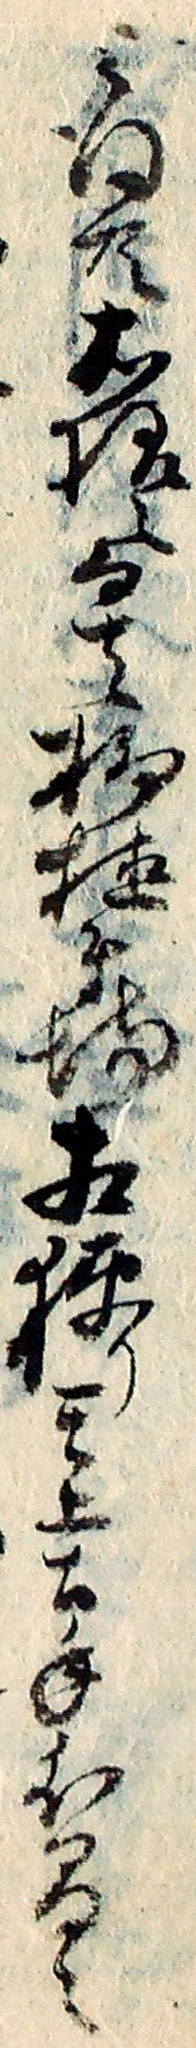候得共右様にては柳植付場相狭り其上土手外間之
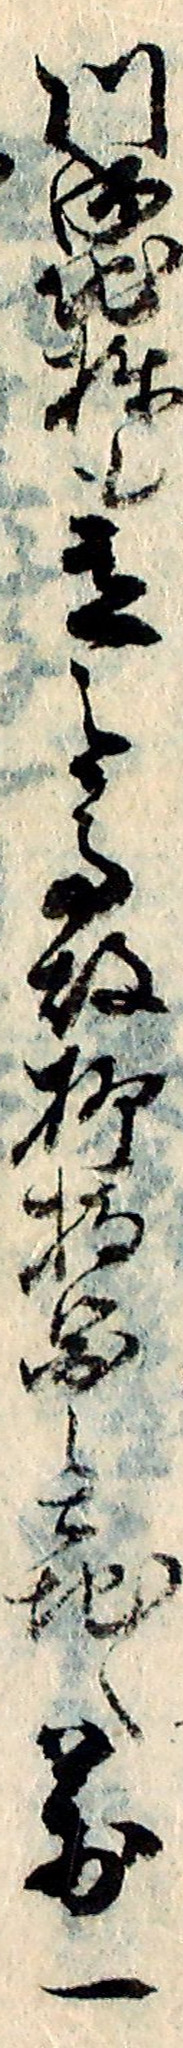川成地株も有之候事故柳指図之土地へ万一
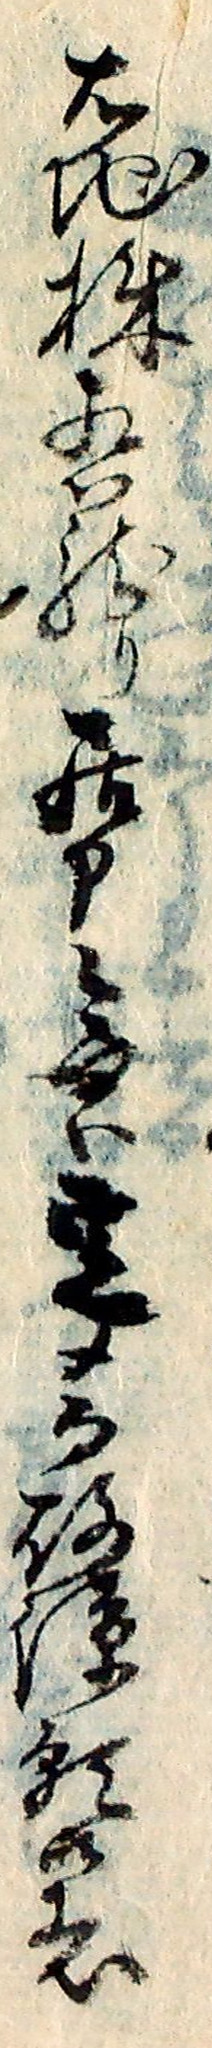右地株相籠り居申候ては定めて故障願候者
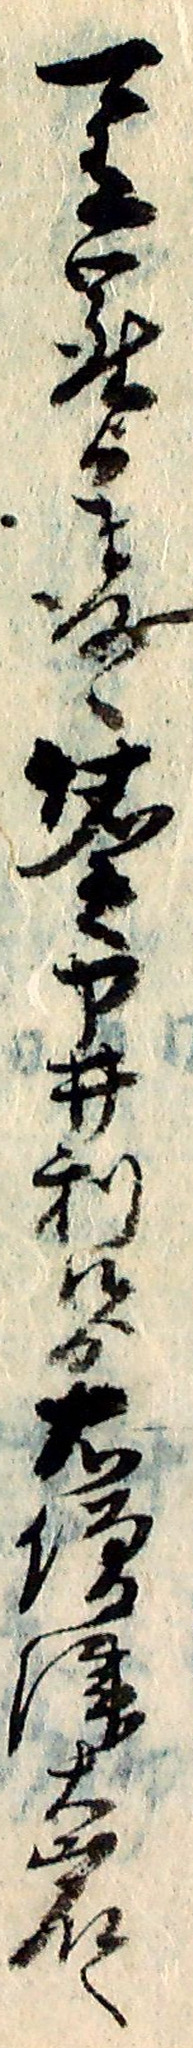可有御座と奉存候依之中井利口ゟ右僧津大岩へ
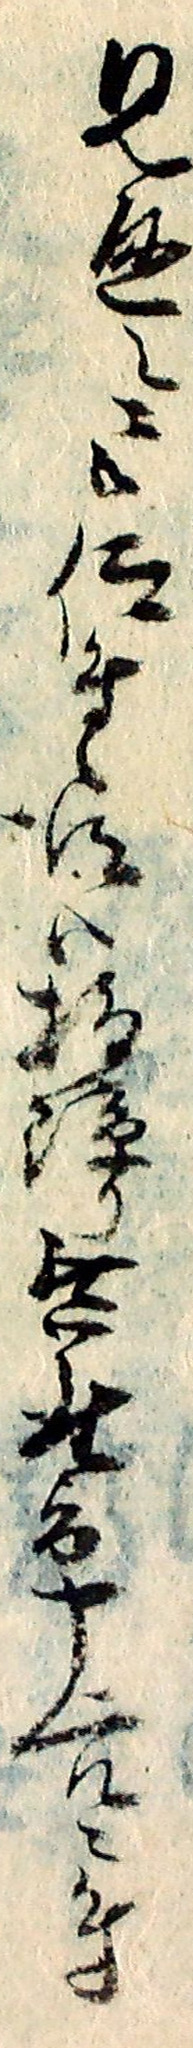見通しに被仰付候得は指障り無御座旨申上候に付
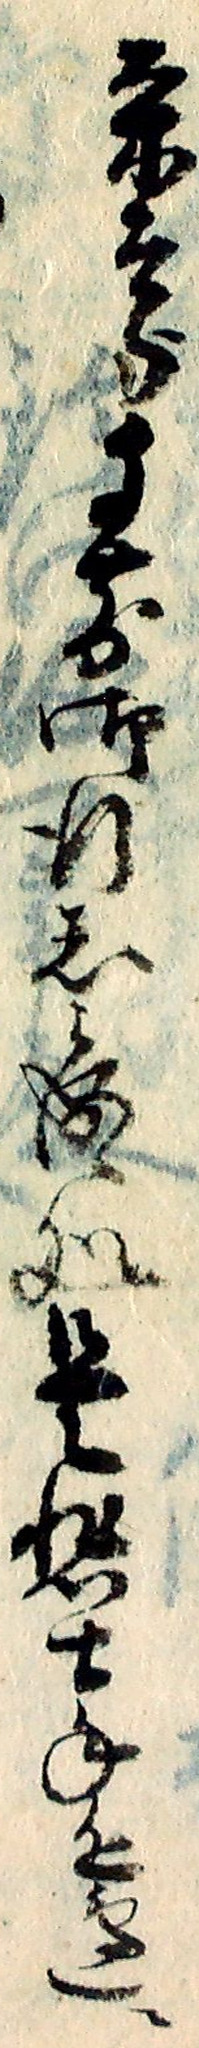栄太郎手前御行着被成候処是悲土手近辺に
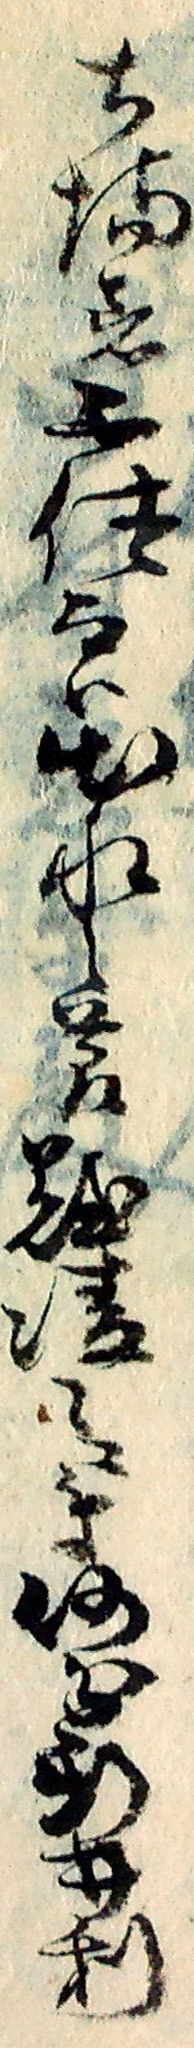土場着不仕候ては出水之節難凌候に付何分新井利
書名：諸御願書控(後藤氏壱番）
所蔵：鳴門教育大学 Naruto University of Education
